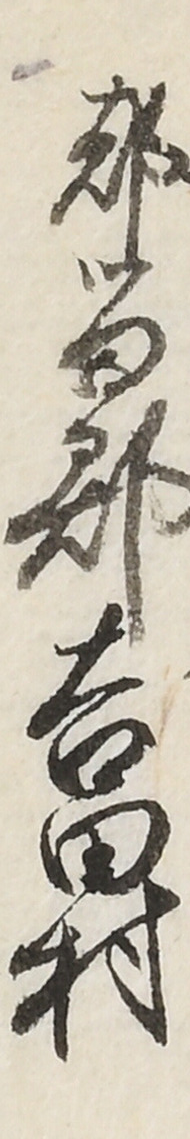都留郡吉田村

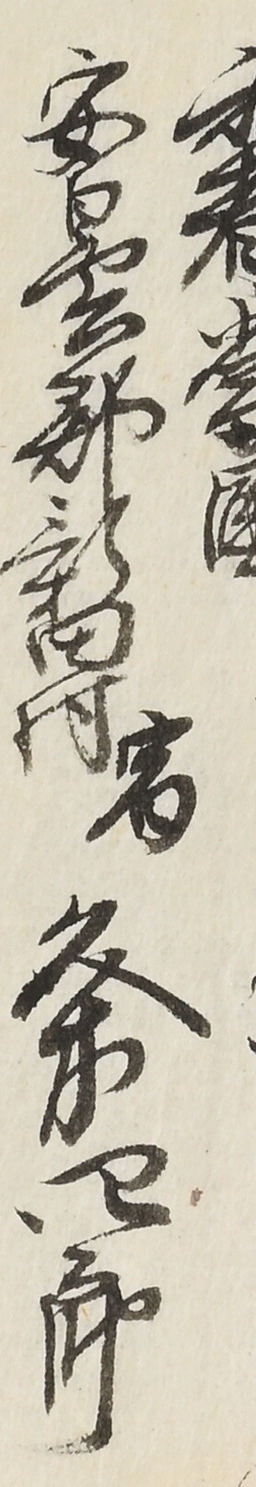安曇郡新田村宿粂四郎

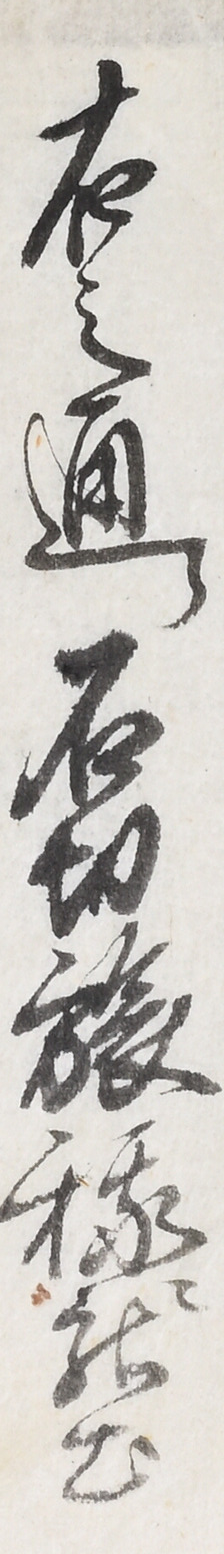右之通り石切旅稼ニ罷出
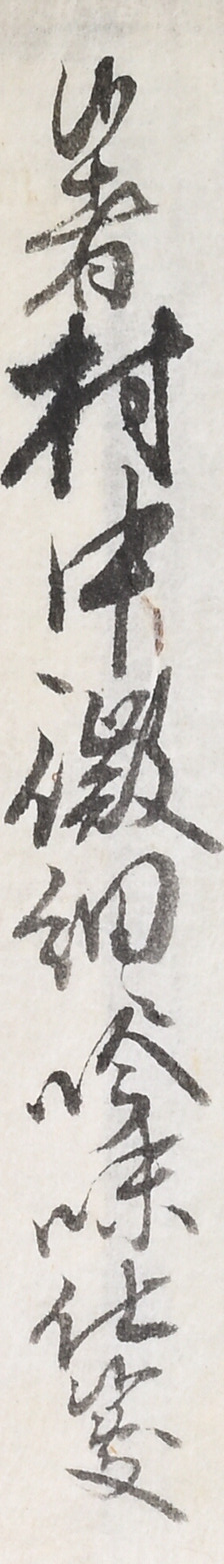候者村中微細ニ吟味仕候処
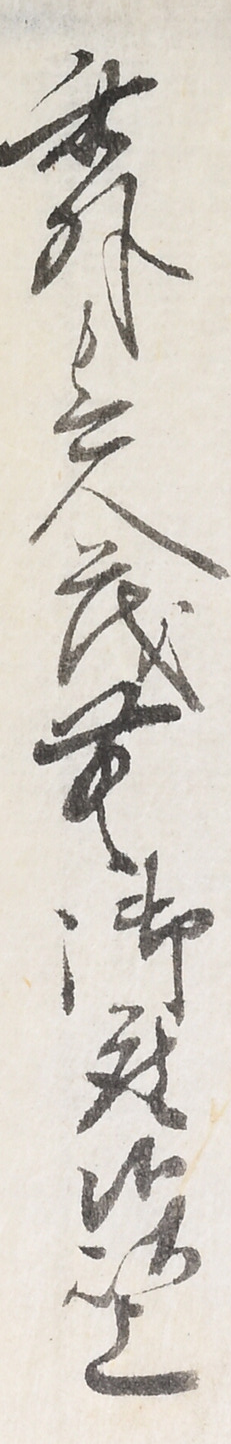此外壱人も無御座候以上
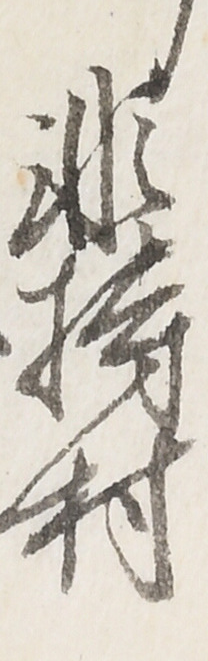非持村
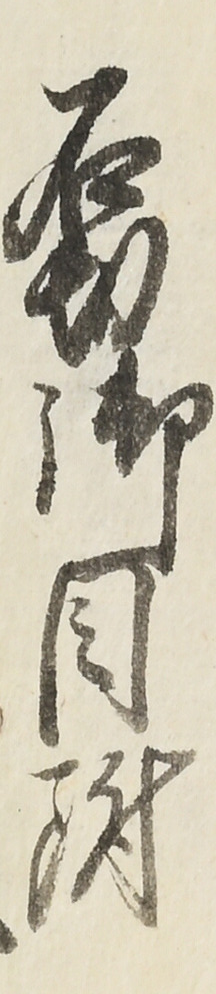石切御目附
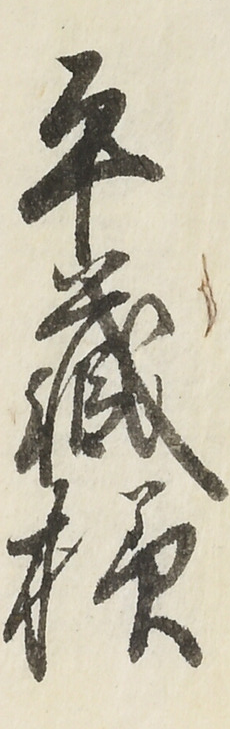平蔵様
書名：萬延二辛酉年正月石切旅稼名前書上帳
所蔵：伊那市立高遠町図書館・合同会社AMANE
